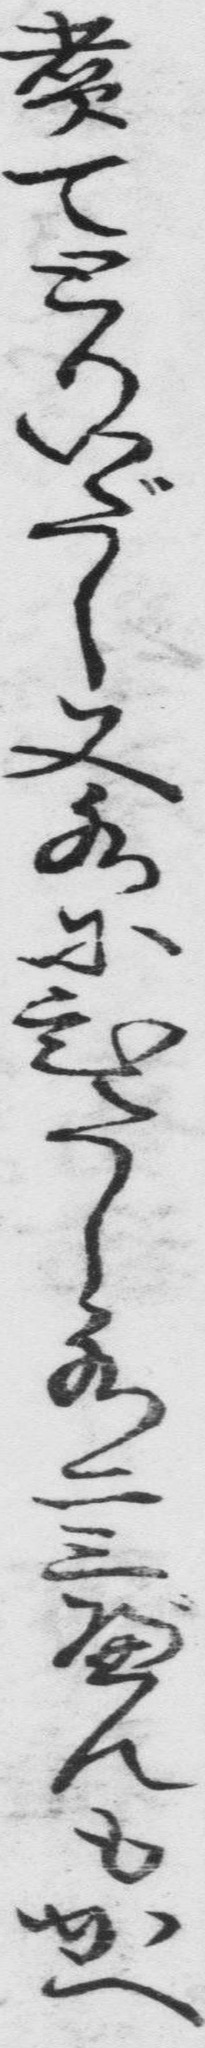煮てとりいだし又水煮飛たし水二三扁んもかへ
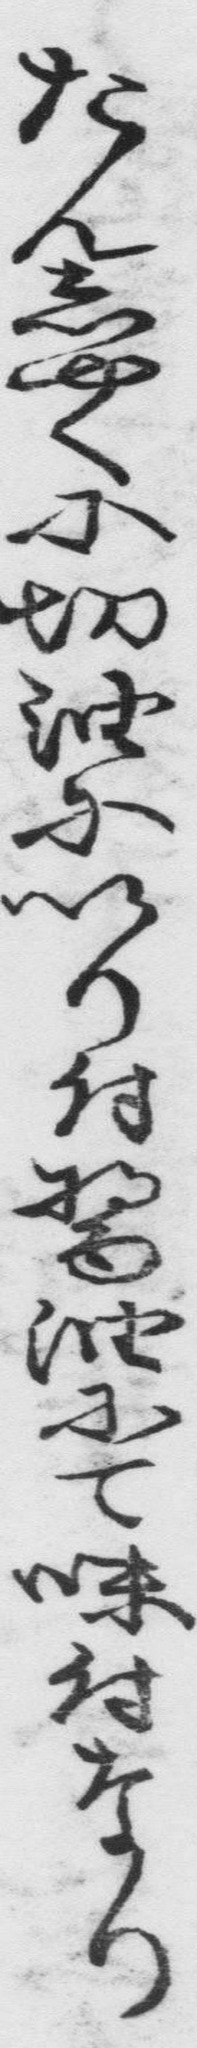たん志やく尓切油尓以り付醤油尓て味付なり
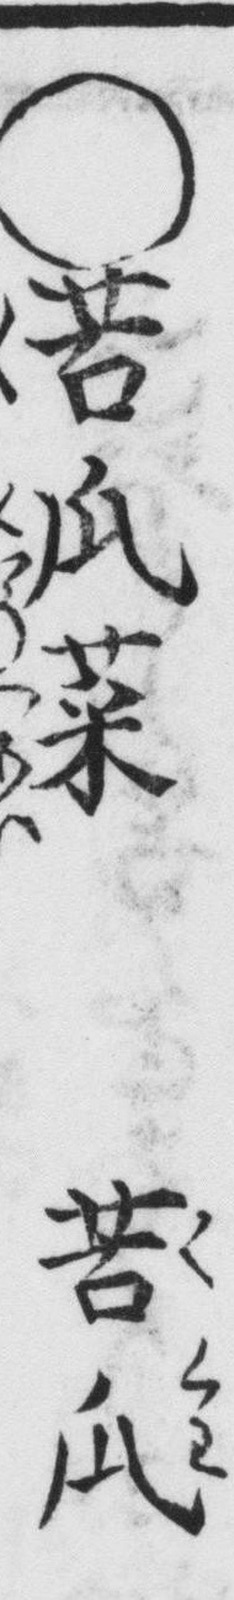◯苦瓜菜苦瓜
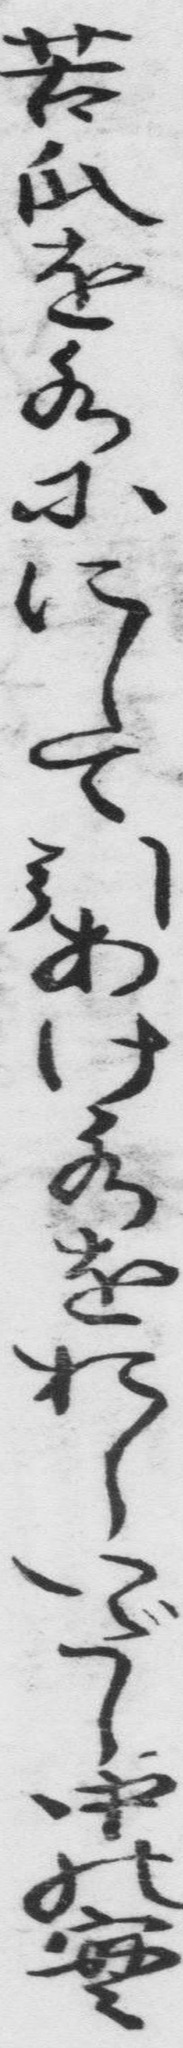苦瓜を水尓にして引あけ水を於しいだし中能實
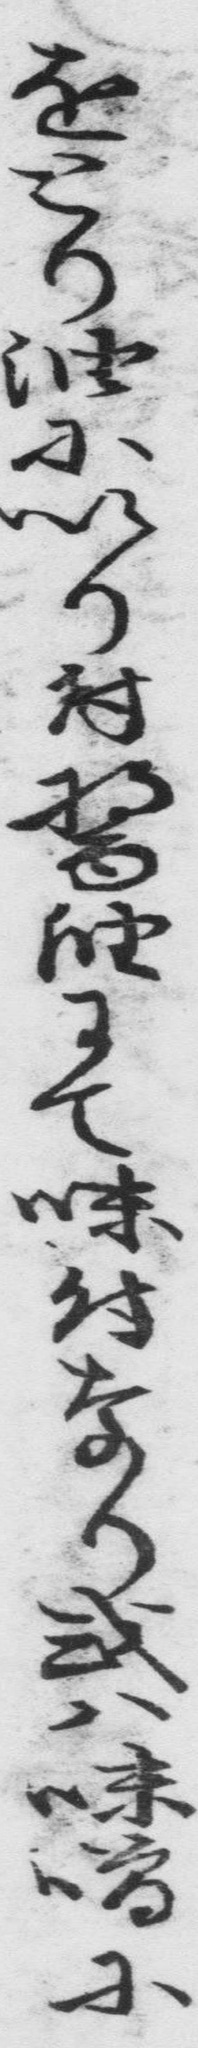をとり油尓以り付醤油尓て味付なり或は味噌尓
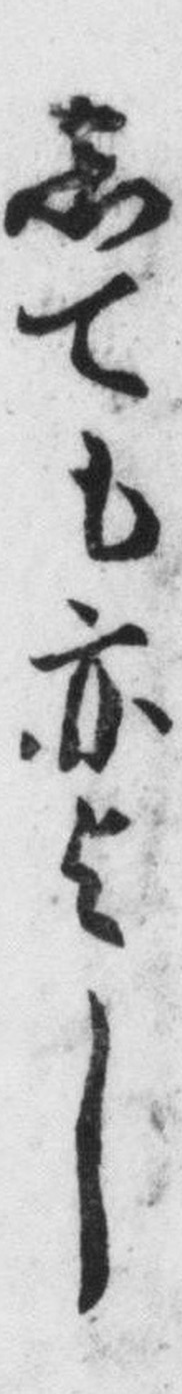志ても亦与し
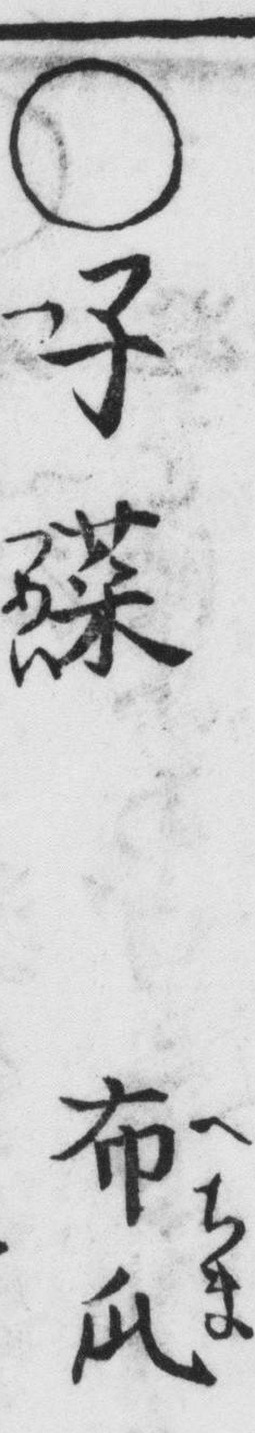◯子菜布瓜
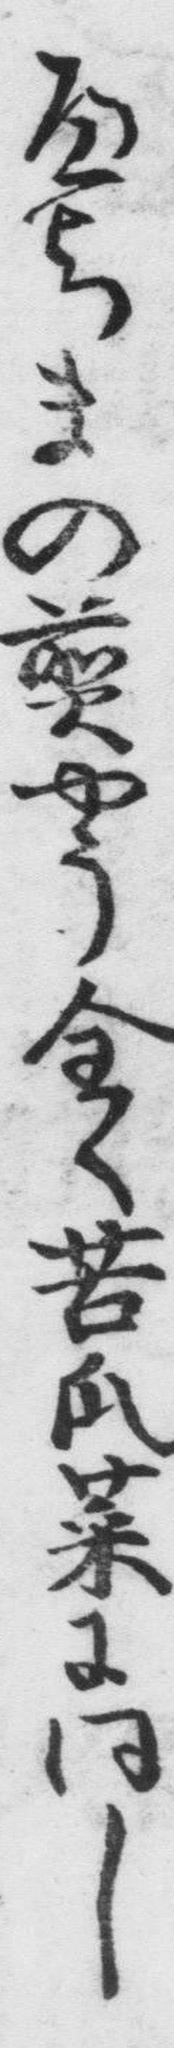扁ちまの煎やう全く苦瓜菜尓同し
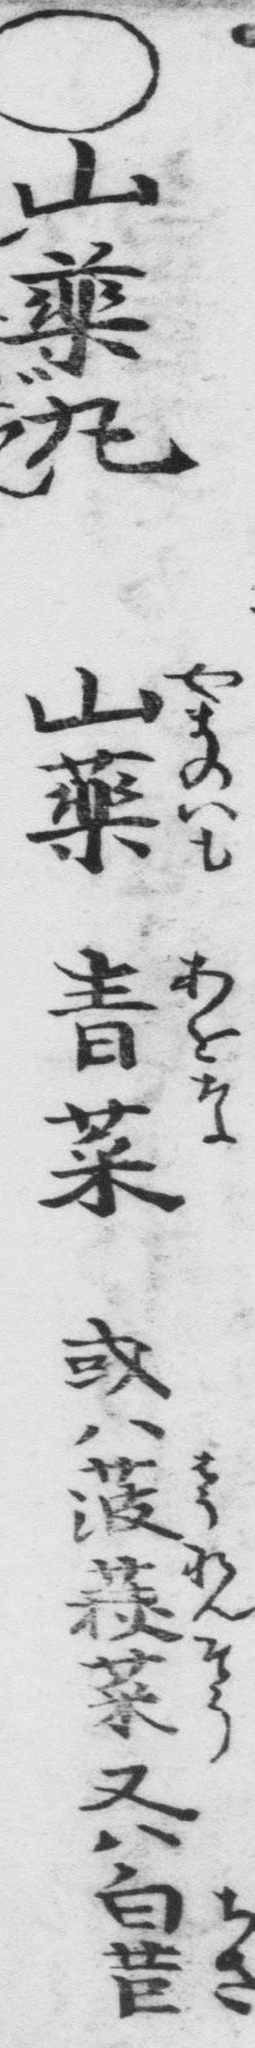◯山薬丸山薬青菜或は菠薐菜又は白苣
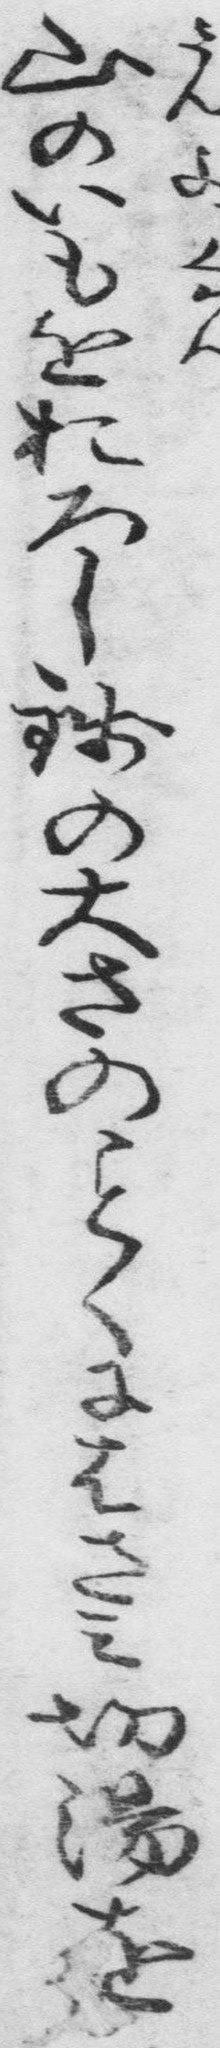山のいもを於ろし鉢の大さのことく尓はさみ切湯を

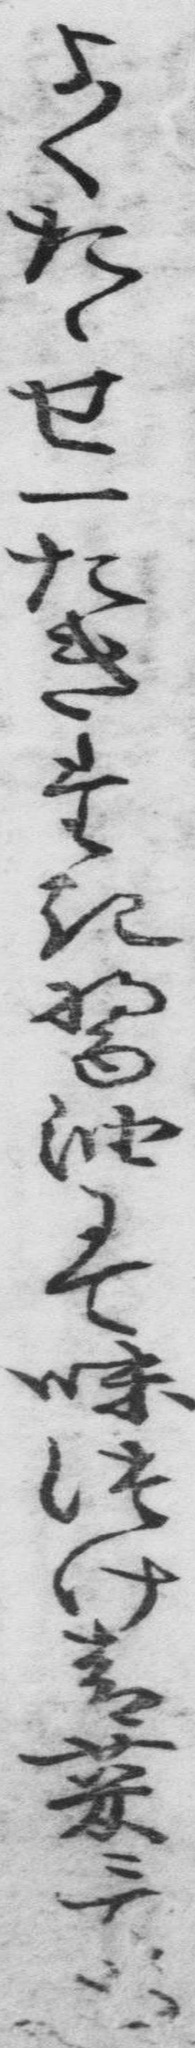よくたゝせ一たき堂起醤油尓て味徒け青菜にても
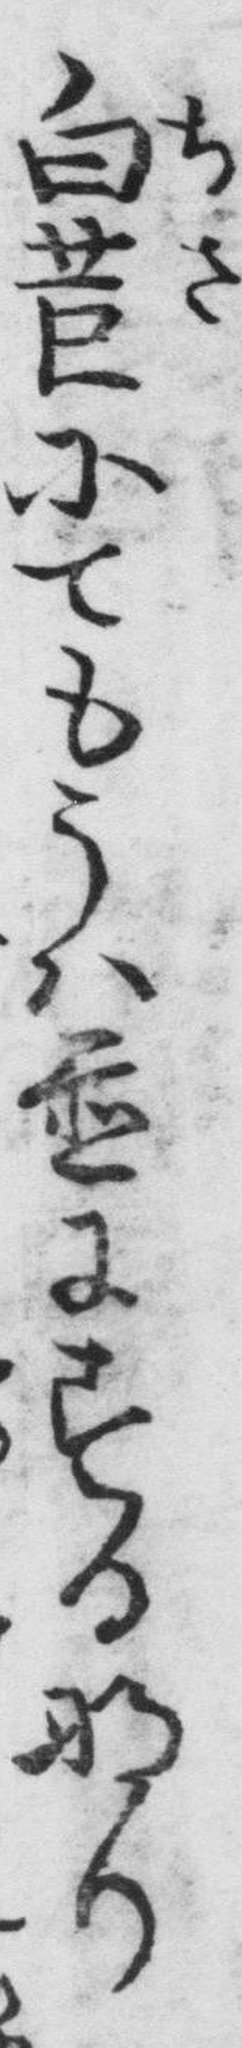白苣尓てもらは置尓春る那り
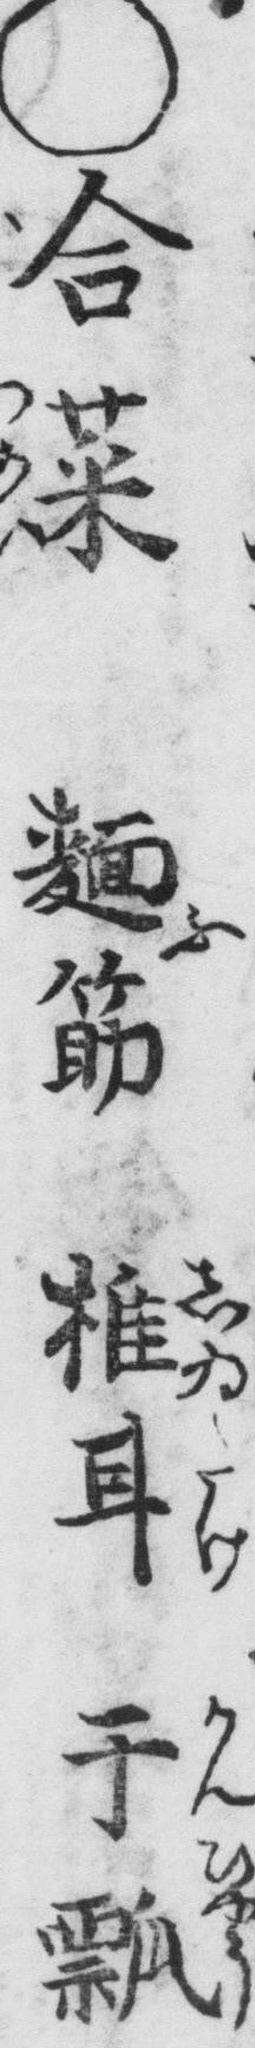〇合菜麺筋椎茸干瓢
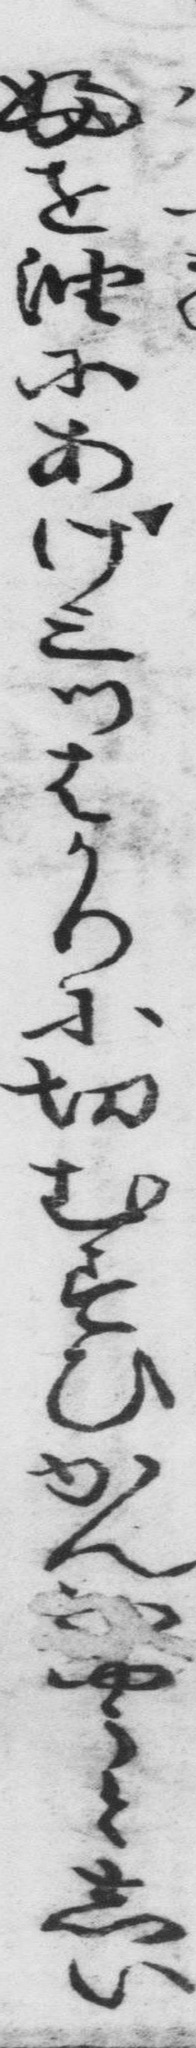婦を油尓あげ三ツはかり尓切む春ひかんひやうと志い
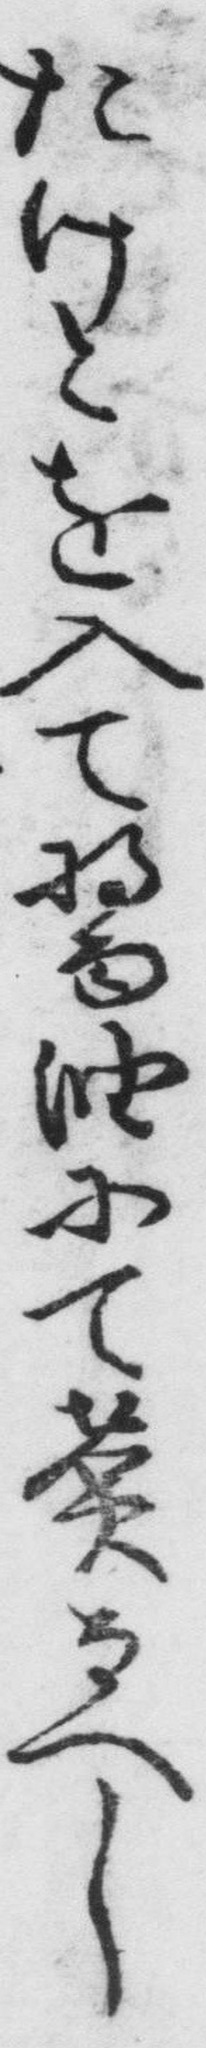たけとを入て醤油尓て煮るへし
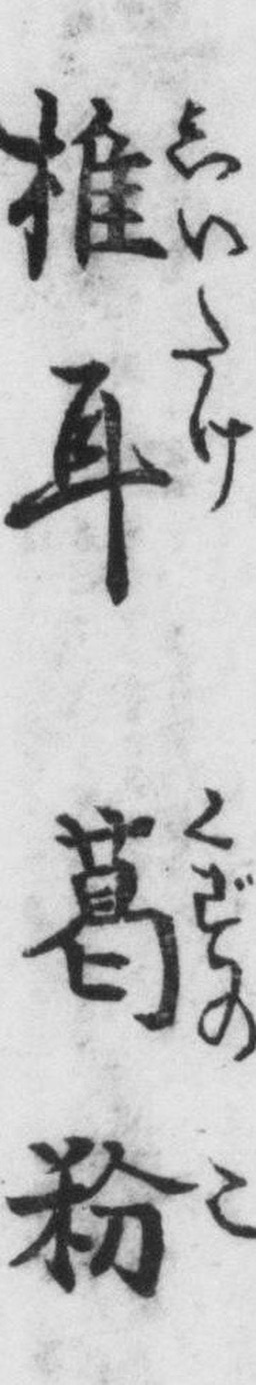椎茸葛粉
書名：普茶料理抄
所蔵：大阪府立大学学術情報センター 国文学研究資料館
